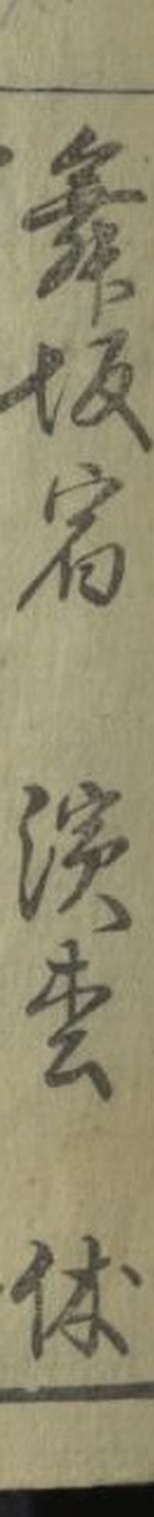舞坂宿濱松休
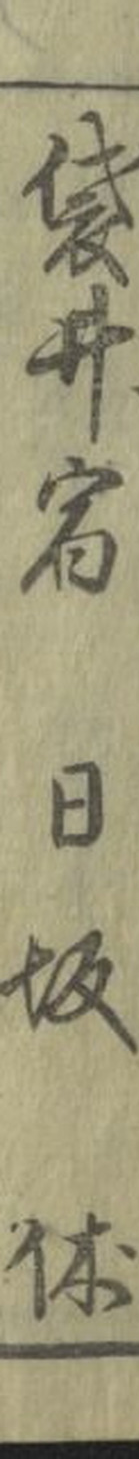袋井宿日坂休
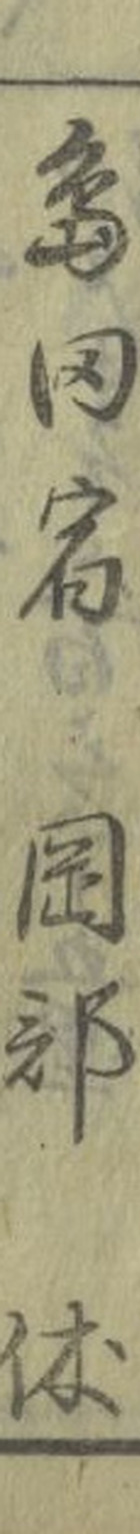島田宿岡部休
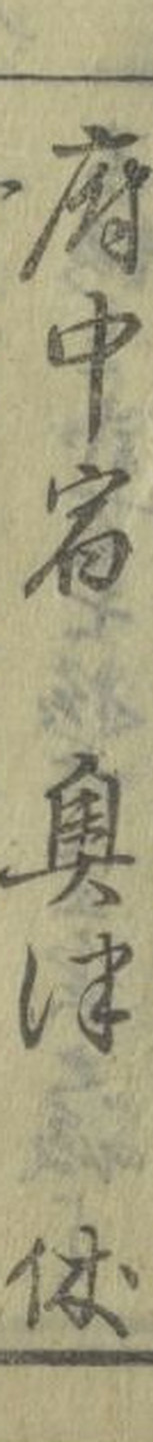府中宿奥津休
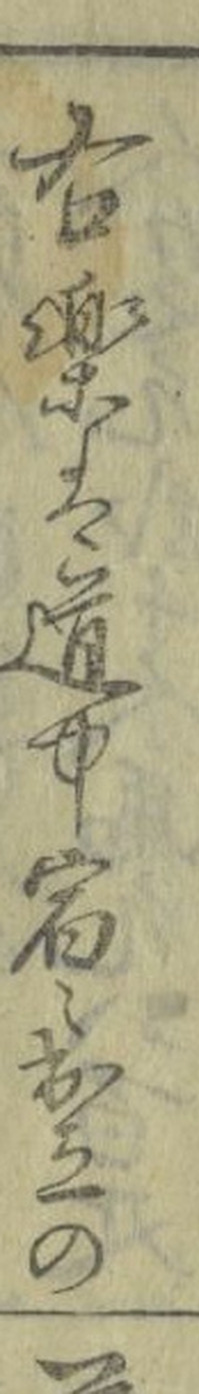右樂は道中宿々出立の
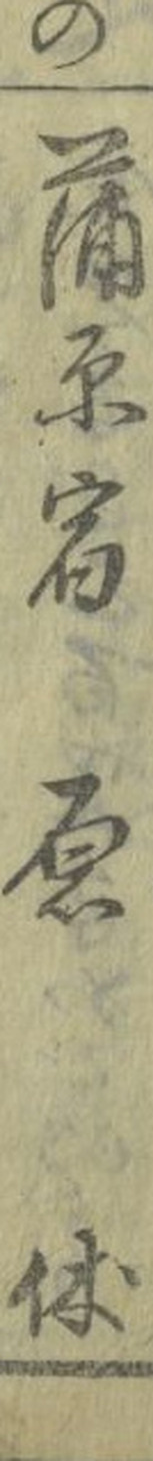蒲原宿原休
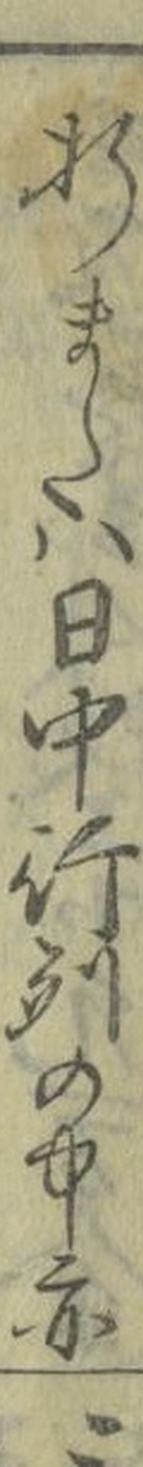折または日中行列の中亦
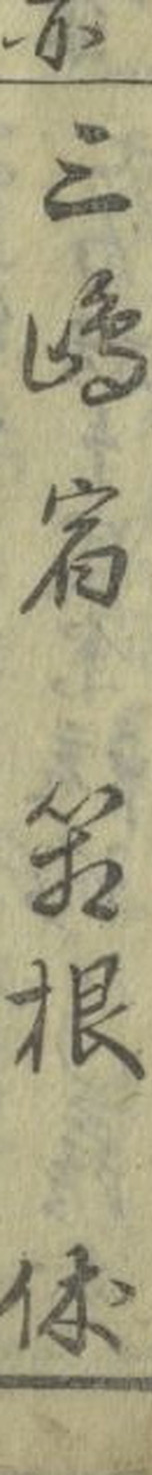三崎宿箱根休
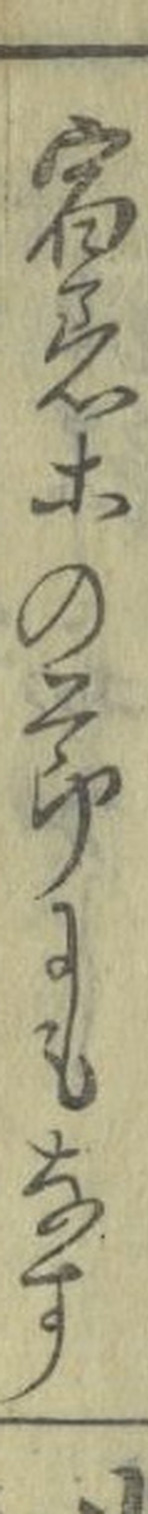宿着等の節にもなす
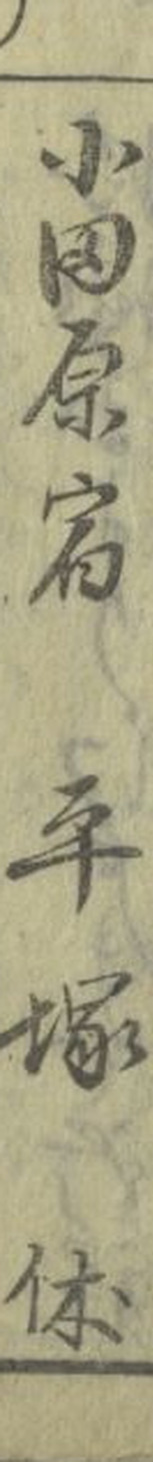小田原宿平塚休
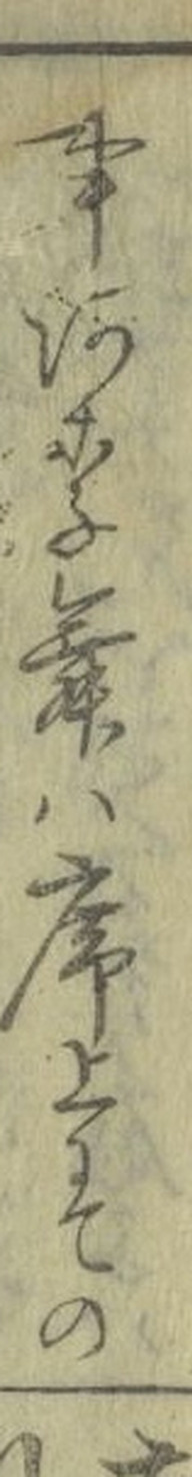事あり舞は席上にての
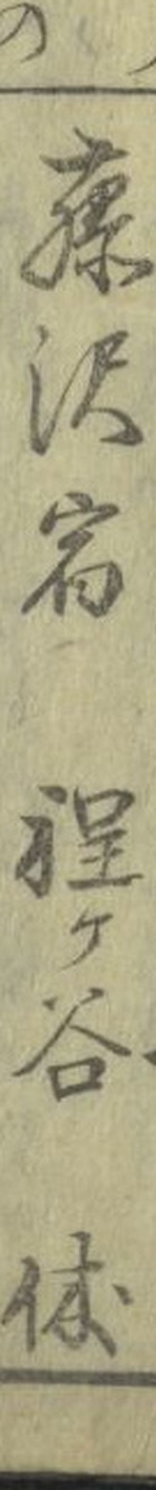藤沢宿程ヶ谷休
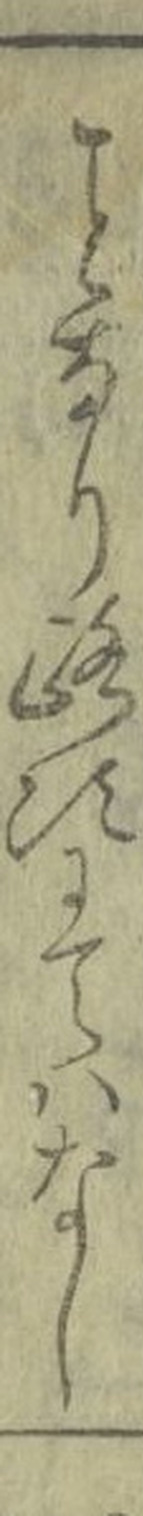ことなり路次にてはなし

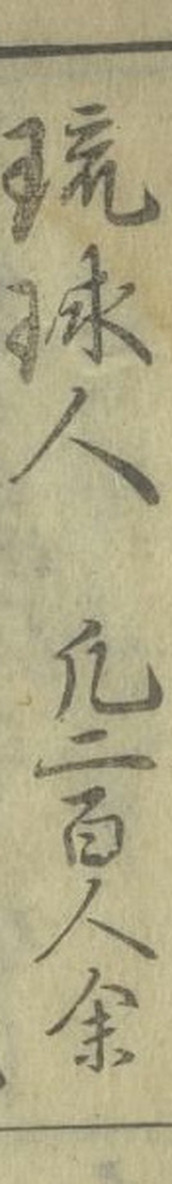琉球人凡二百人余
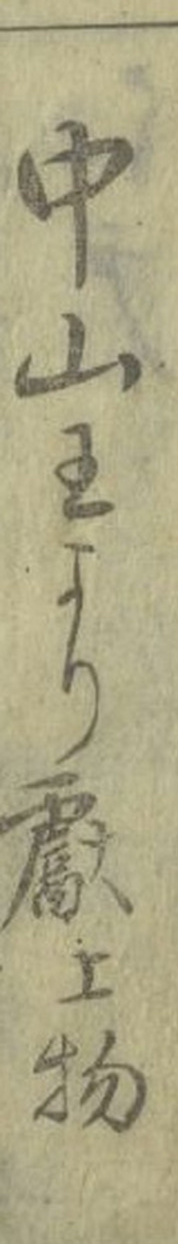中山王より獻上物
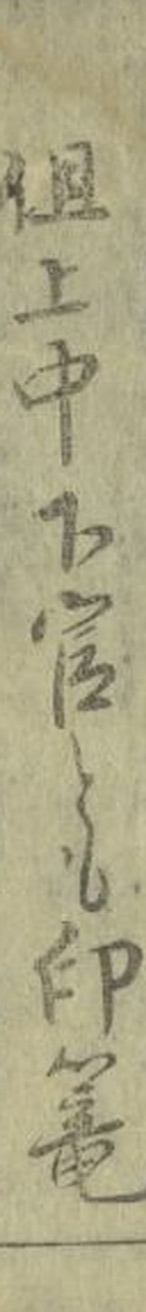但上中下官とも印篭
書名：琉球人行列記
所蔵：University of the Ryukyus Library
